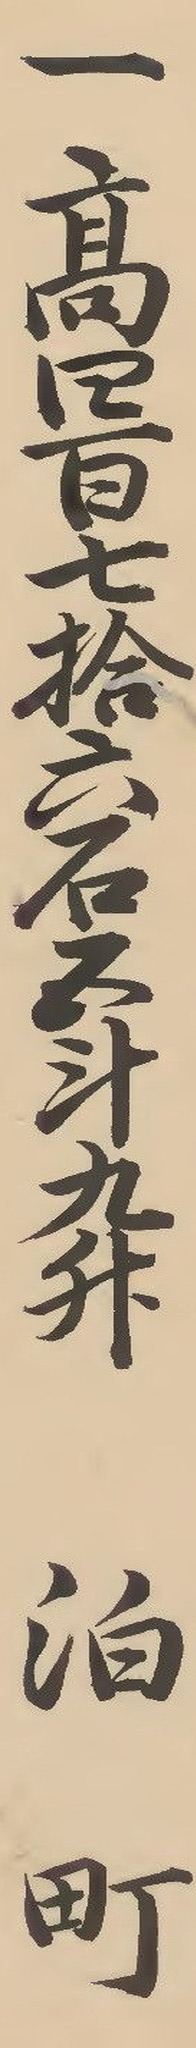一高四百七拾六石五斗九升泊町
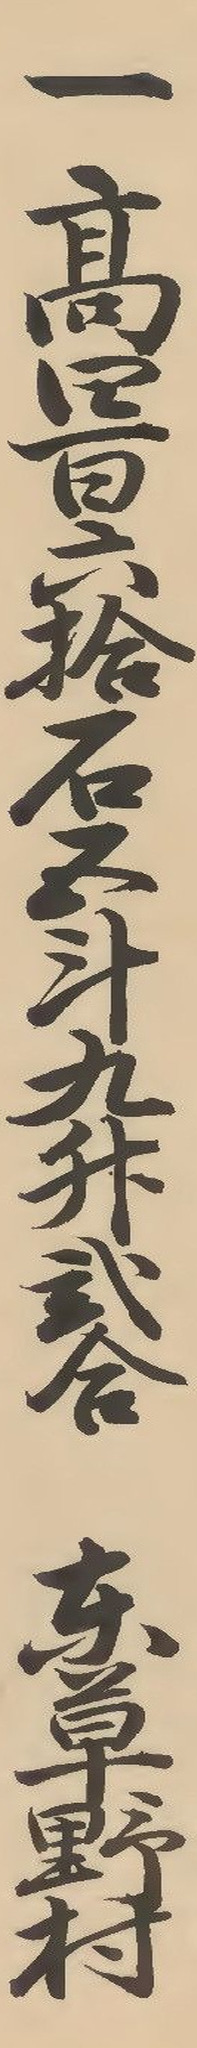一高四百六拾石五斗九升弐合東草野村

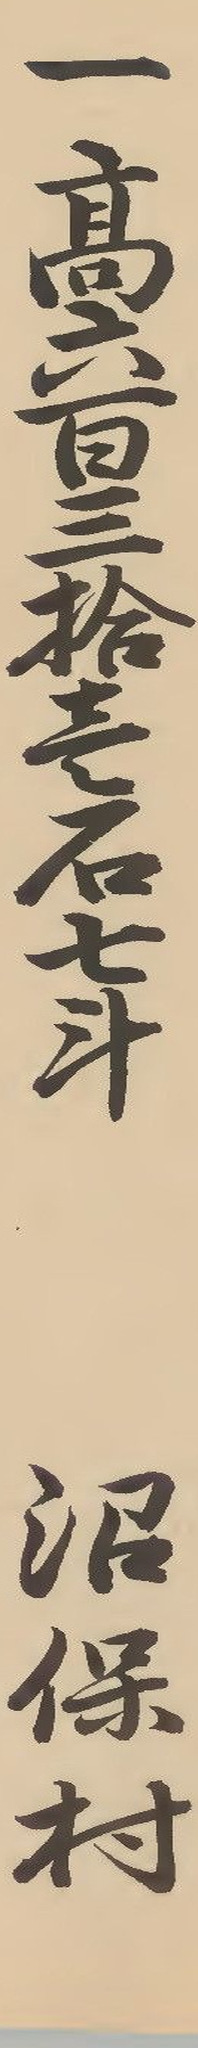一高六百三拾壱石七斗沼保村
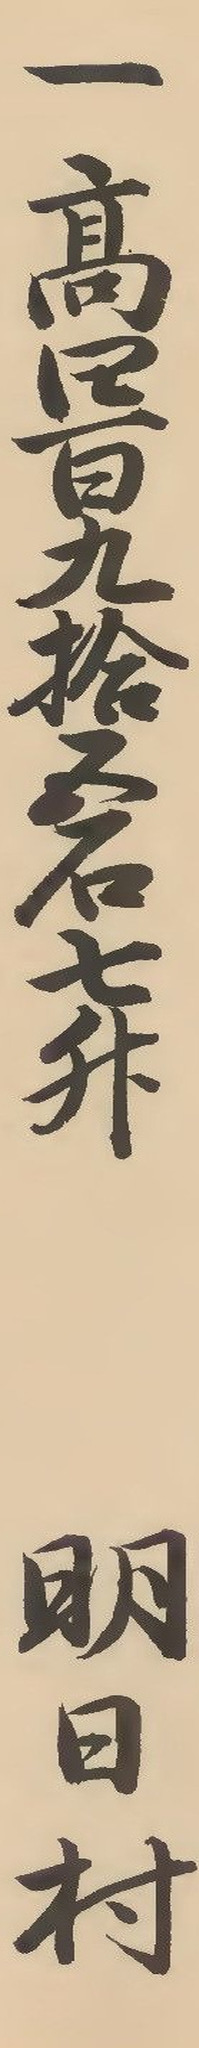一高四百九拾五石七升明日村
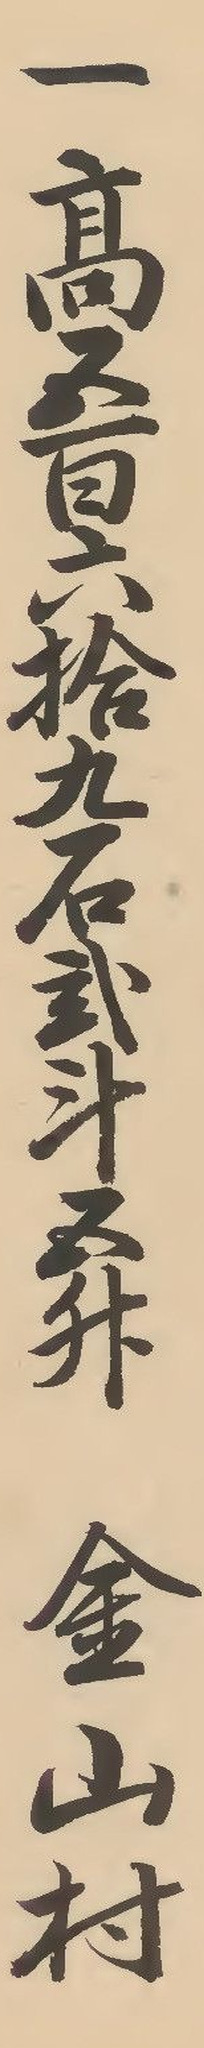一高五百六拾九石弐斗五升金山村

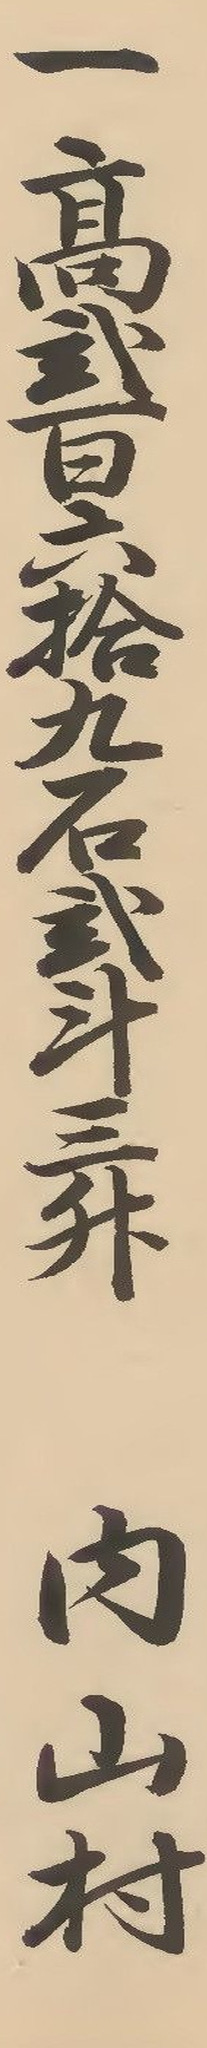一高弐百六拾九石弐斗三升内山村
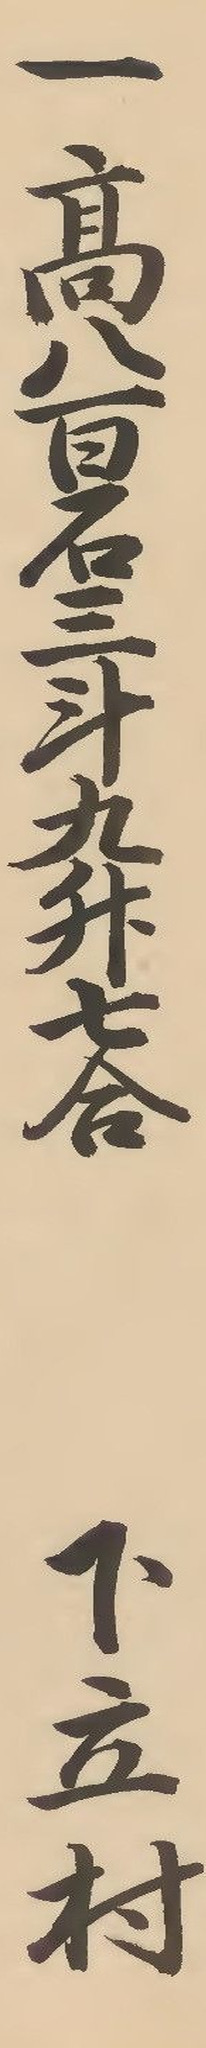一高八百石三斗九升七合下立村
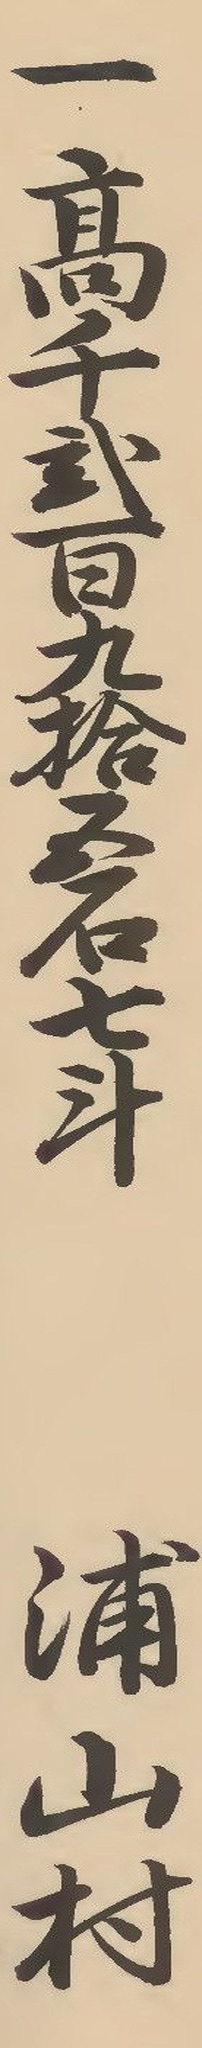一高千弐百九拾五石七斗浦山村
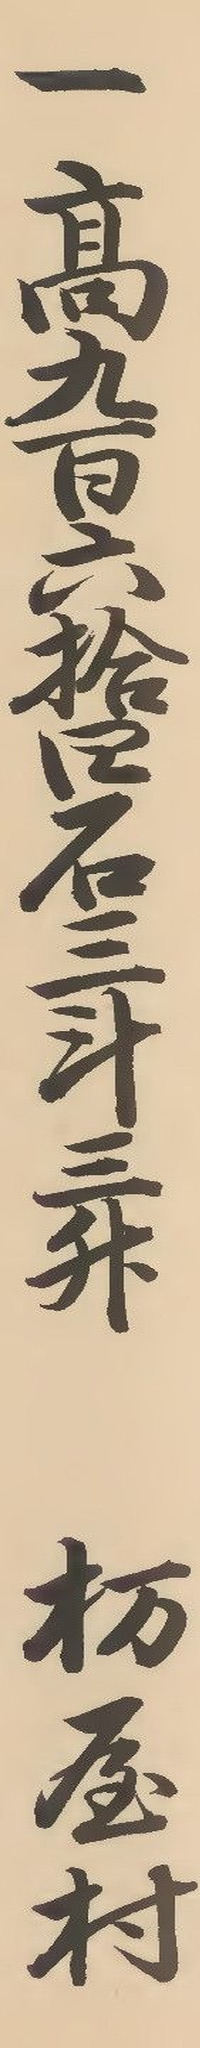一高九百六拾四石三斗三升栃屋村
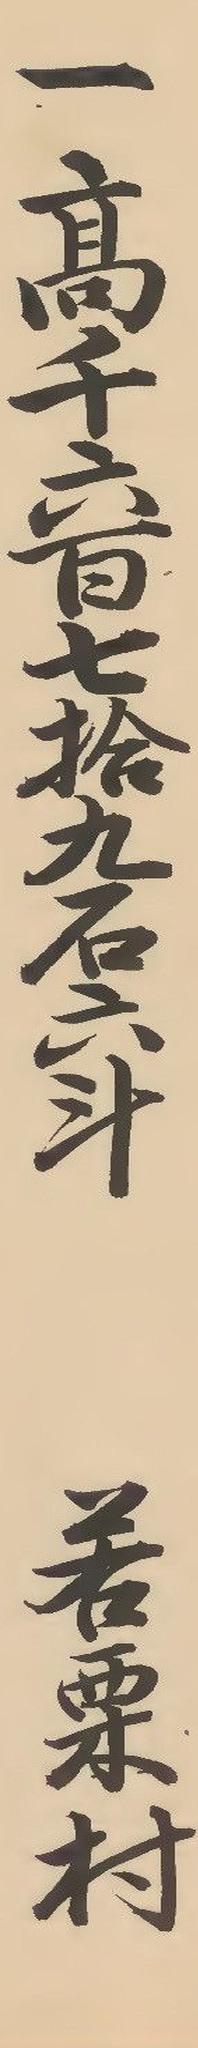一高千六百七拾九石六斗若栗村
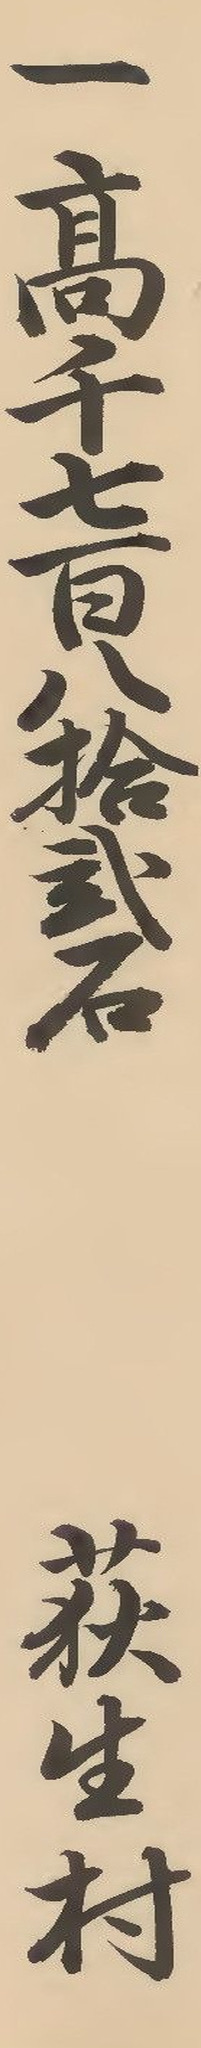一高千七百八拾弐石荻生村
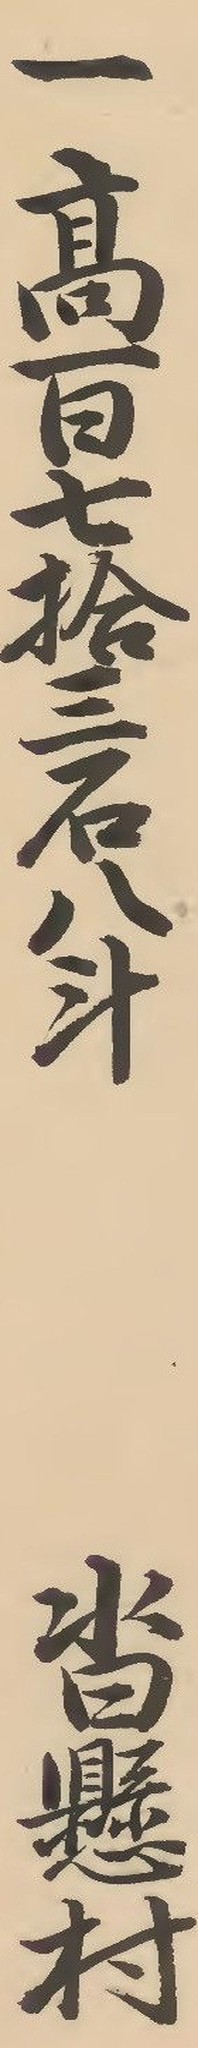一高百七拾三石八斗沓懸村

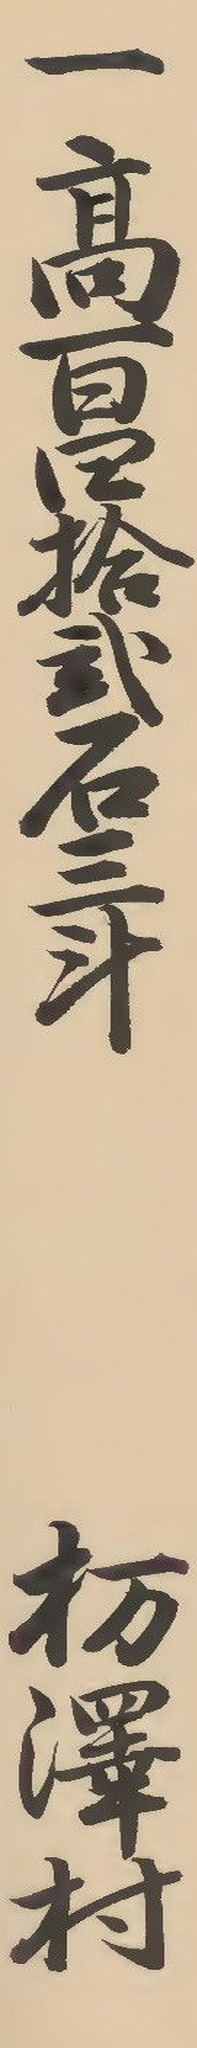一高百四拾弐石三斗栃沢村
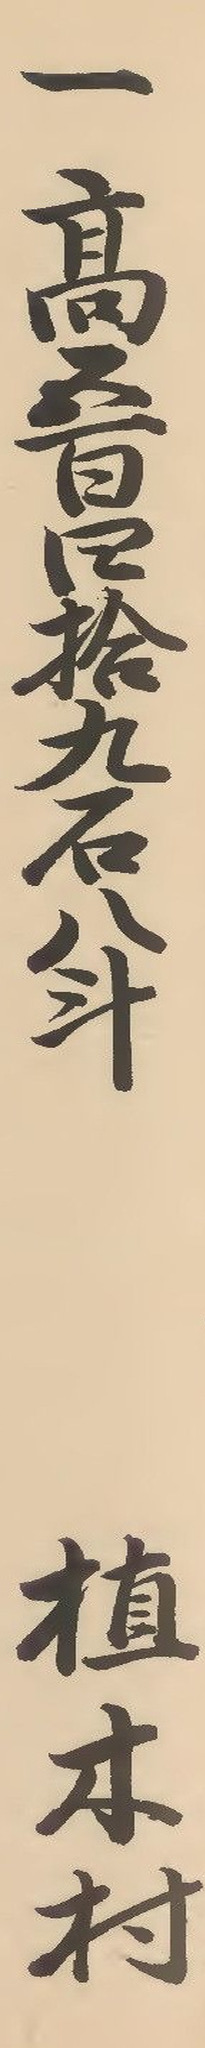一高五百四拾九石八斗植木村
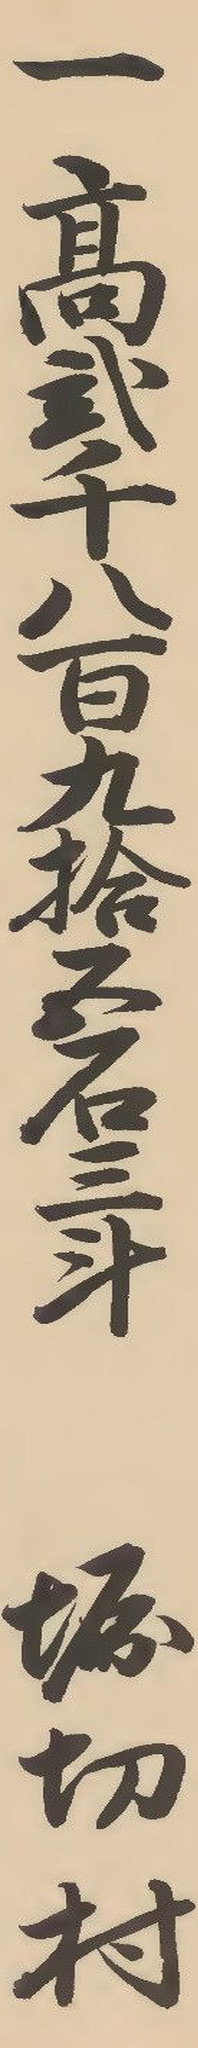一高弐千八百九拾五石三斗堀切村
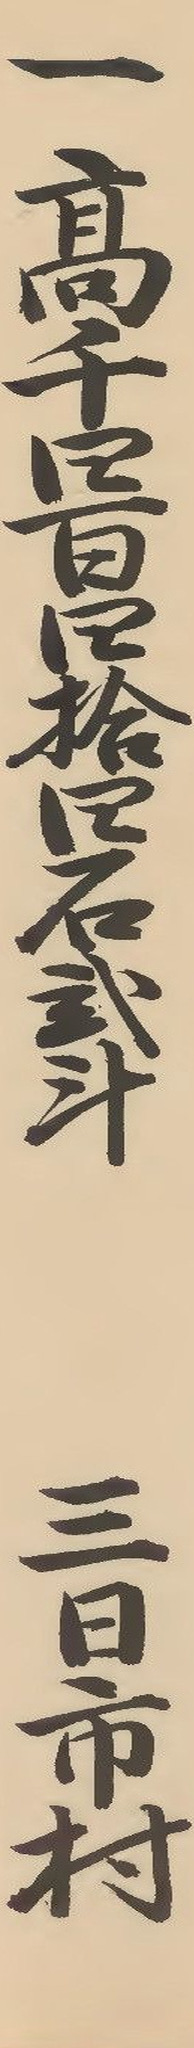一高千四百四拾四石弐斗三日市村
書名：越中国郷帳
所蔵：国立公文書館 National Archives of Japan
